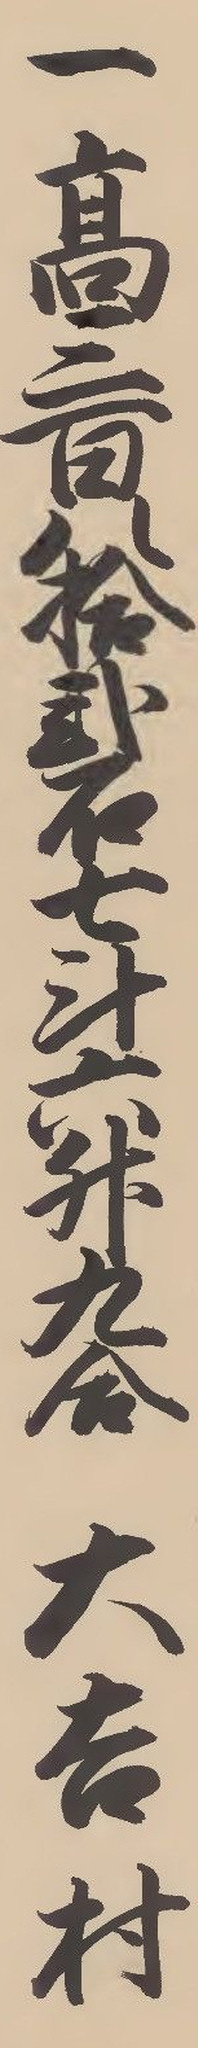一高三百八拾弐石七斗六升九合大吉村
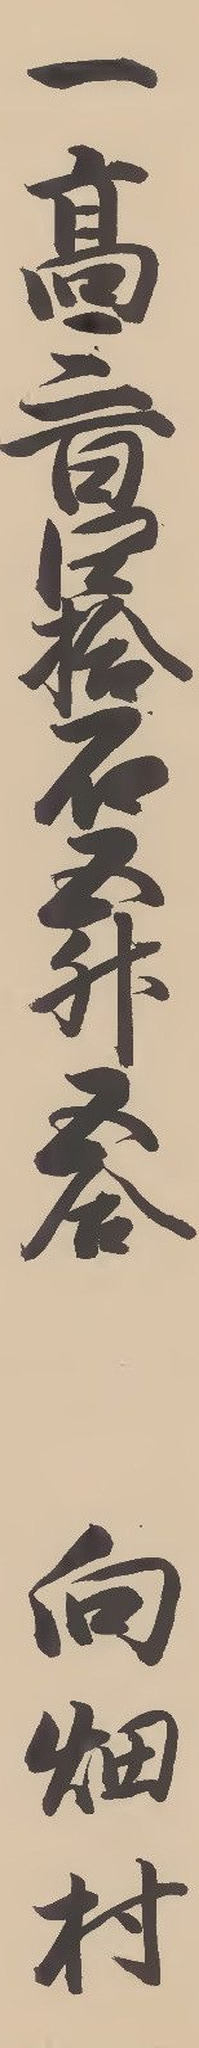一高三百四拾石五升五合向畑村
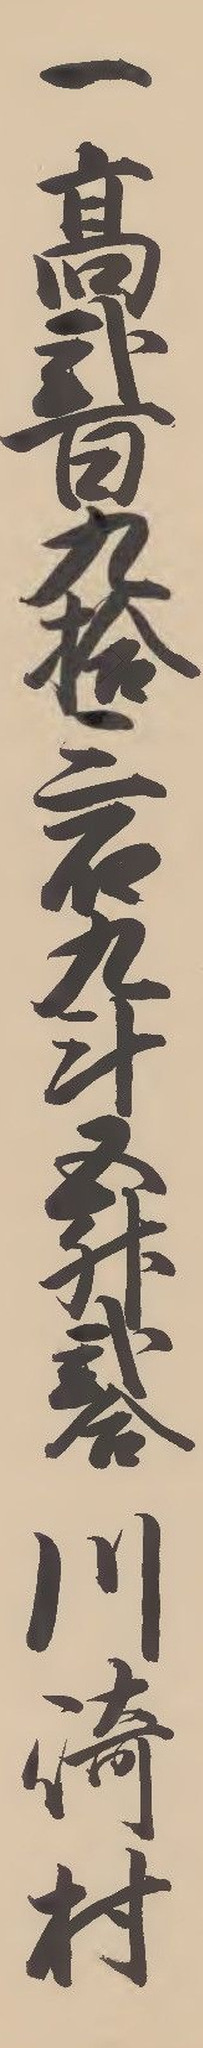一高弐百九拾三石九斗五升弐合川崎村
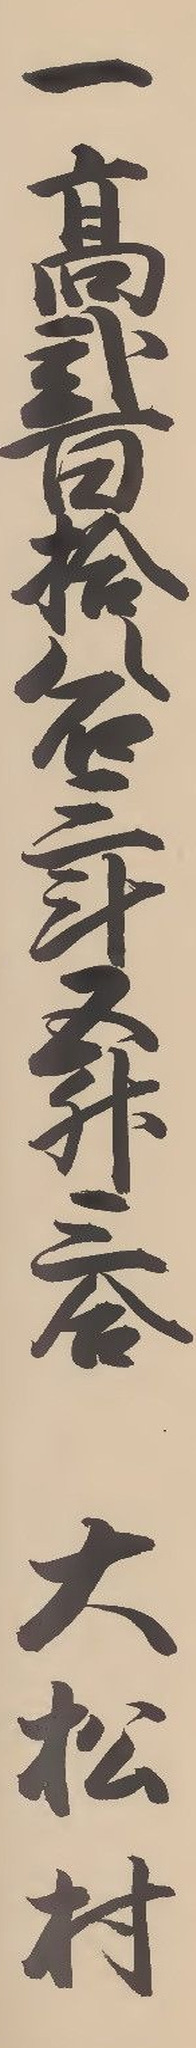一高弐百拾八石三斗五升三合大松村
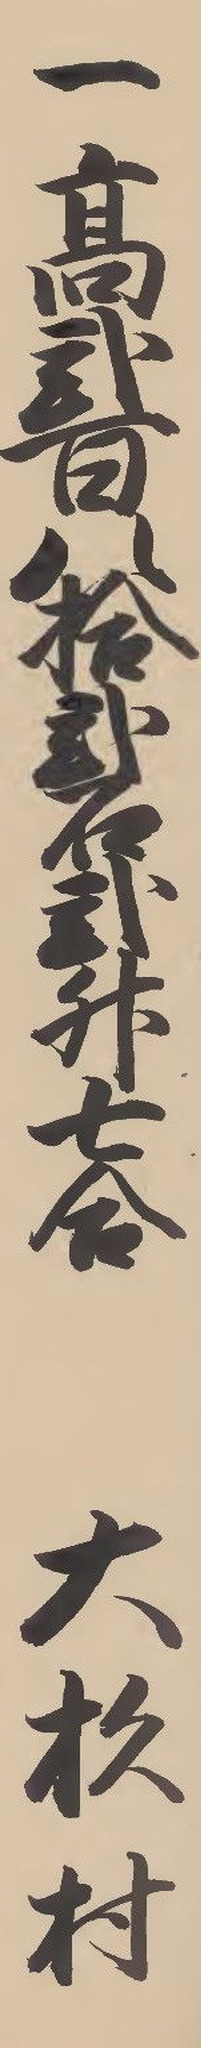一高弐百八拾弐石弐升七合大杉村
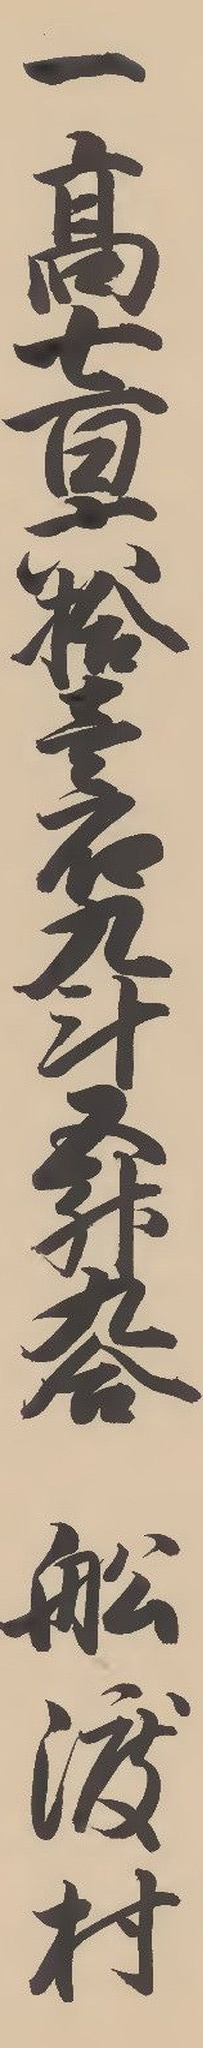一高七百六拾壱石九斗五升九合船渡村
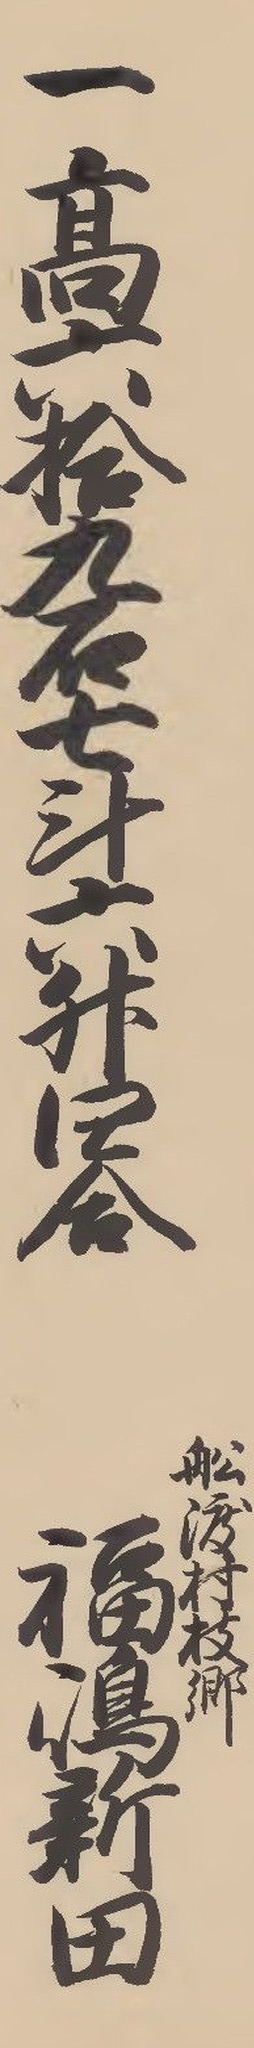一高六拾九石七斗六升四合福嶋新田
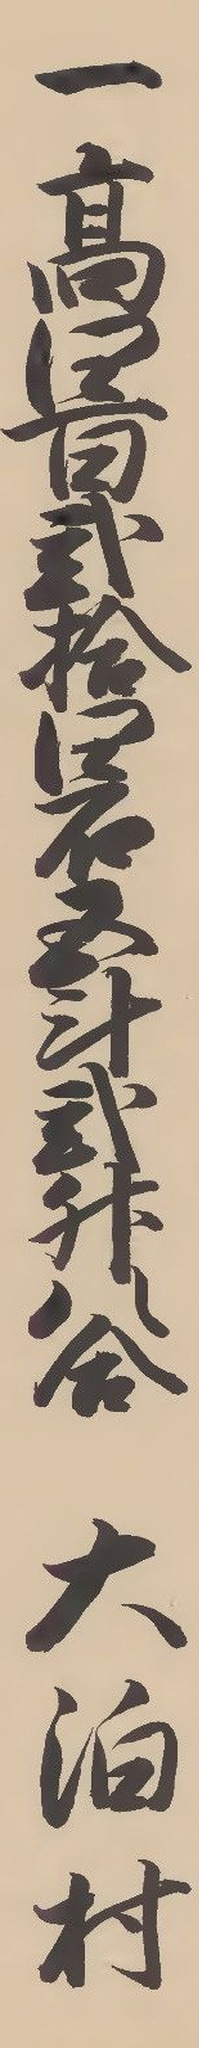一高四百弐拾四石五斗弐升八合大泊村

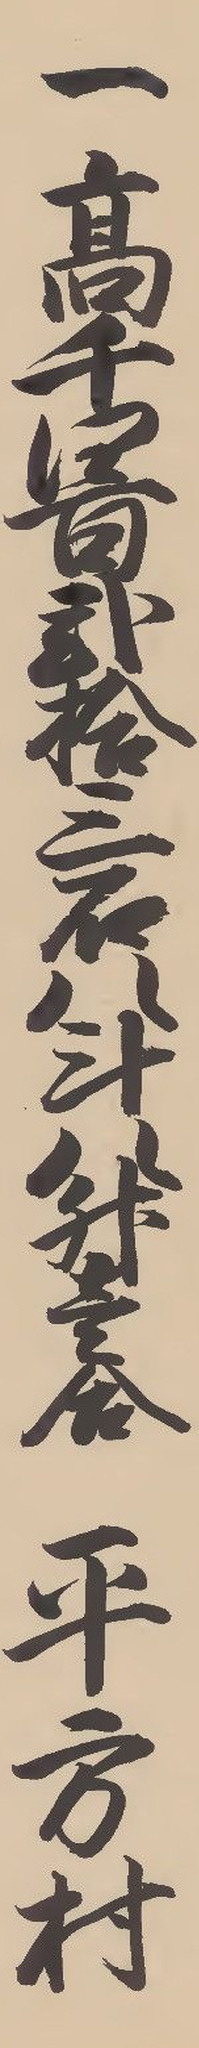一高千四百弐拾三石八斗八升壱合平方村
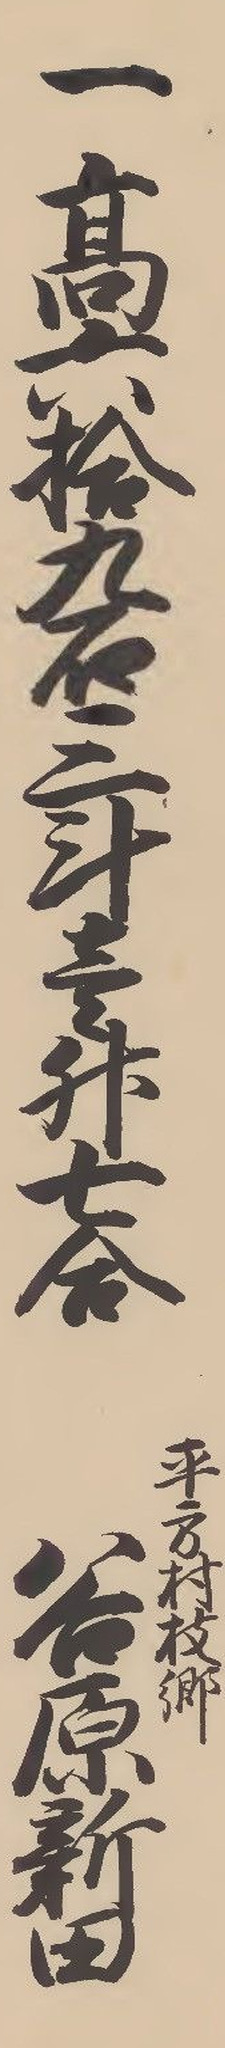一高六拾九石三斗壱升七合谷原新田
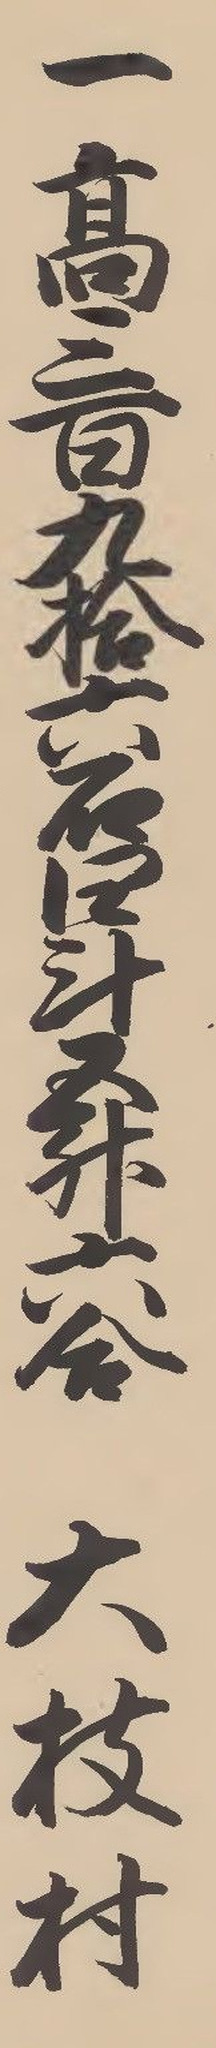一高三百九拾六石四斗五升六合大枝村
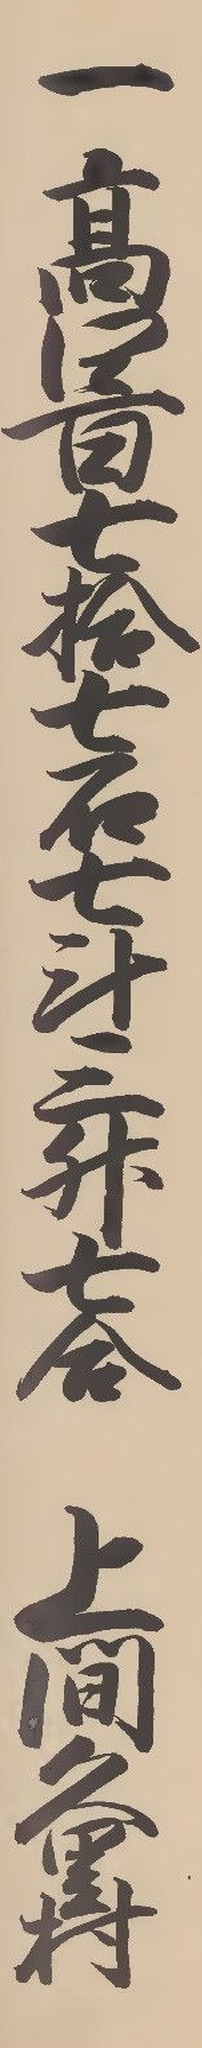一高四百七拾七石七斗三升七合上間久里村
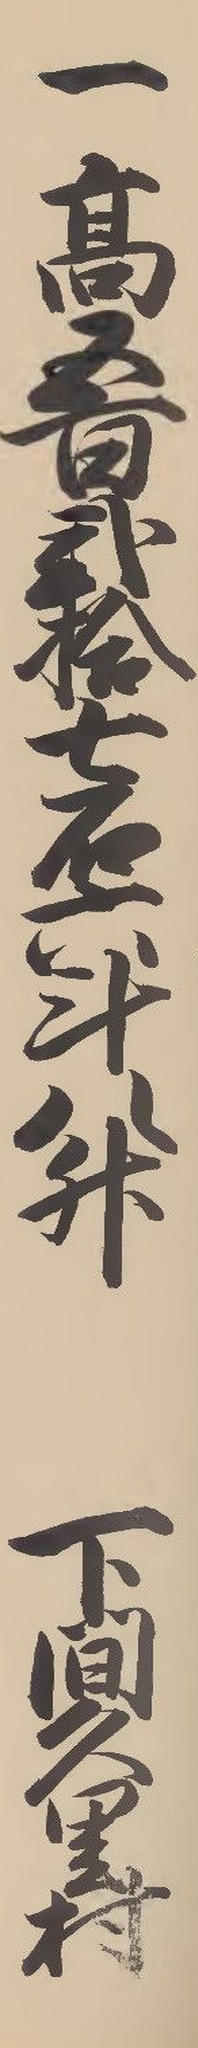一高五百弐拾七石六斗八升下間久里村
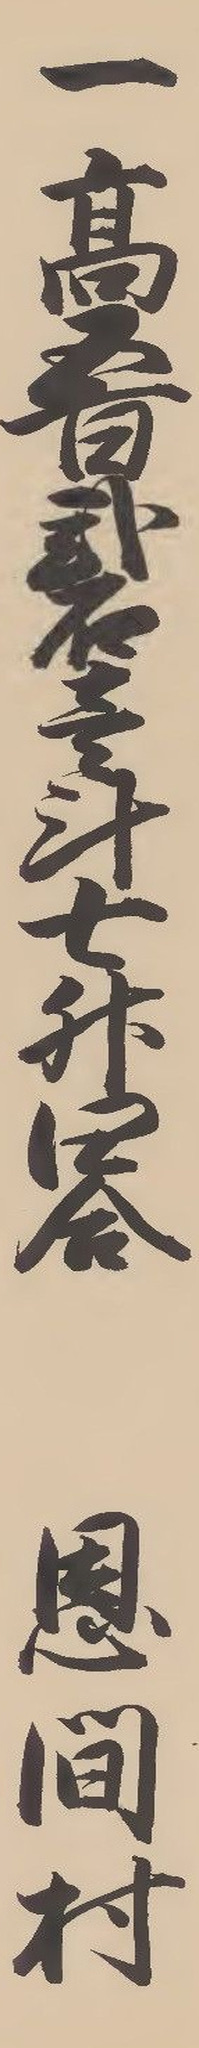一高五百弐石壱斗七升四合恩間村
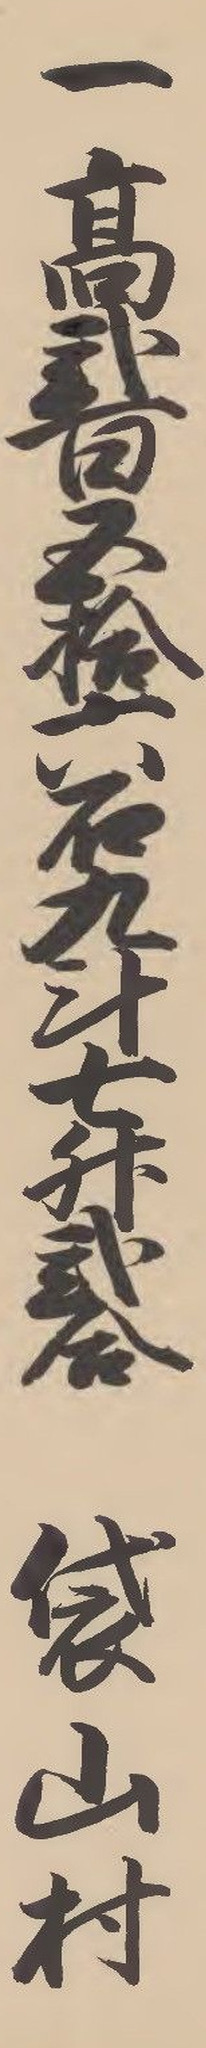一高弐百五拾六石九斗七升弐合袋山村
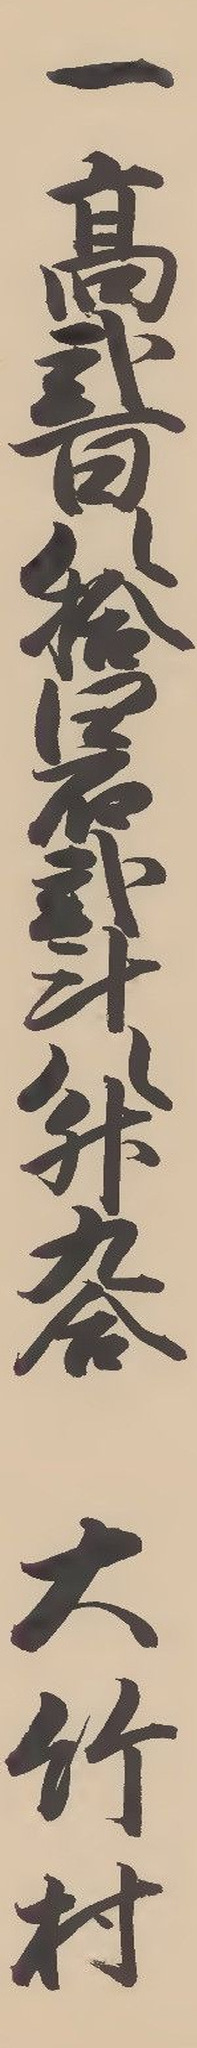一高弐百八拾四石弐斗八升九合大竹村
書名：武蔵国郷帳　下
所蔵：国立公文書館 National Archives of Japan
